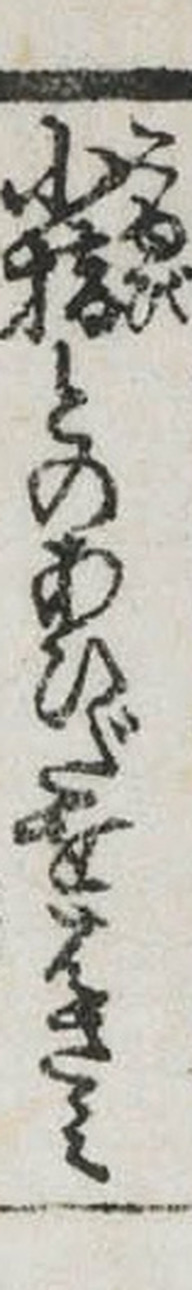小指とのあひだをはさみ
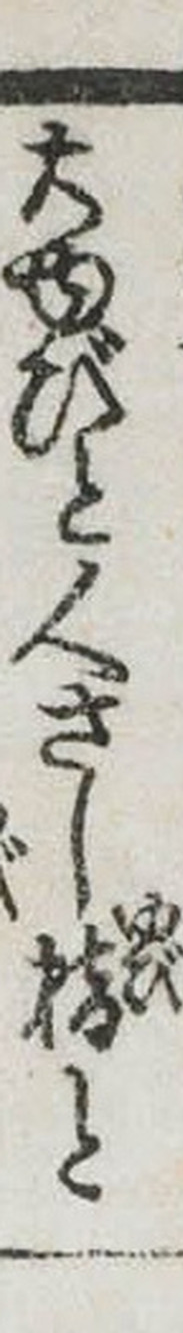大ゆびと人さし指と
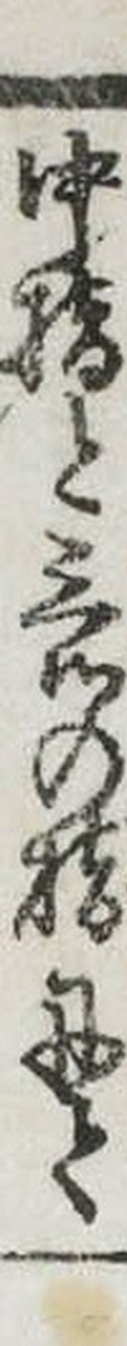中指と三ッの指にて
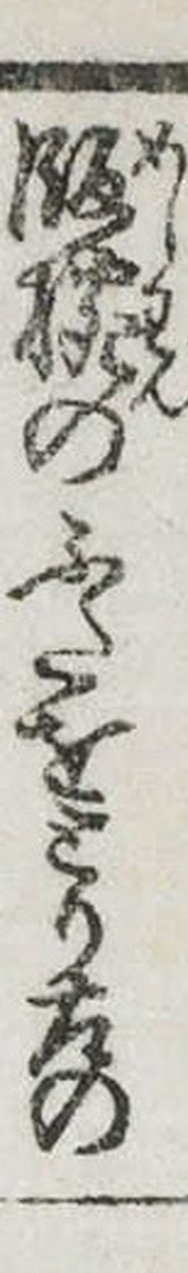飯椀のふたをとり左の
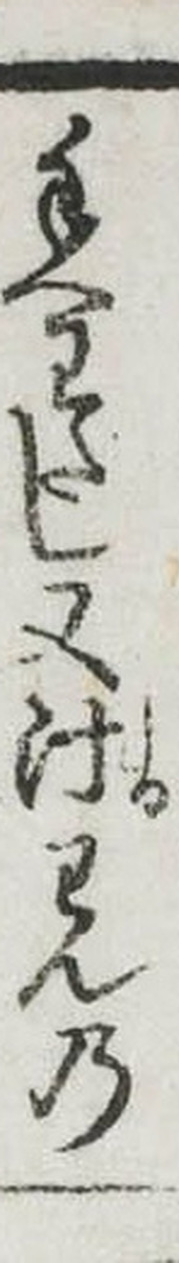手へわたし又汁わんの
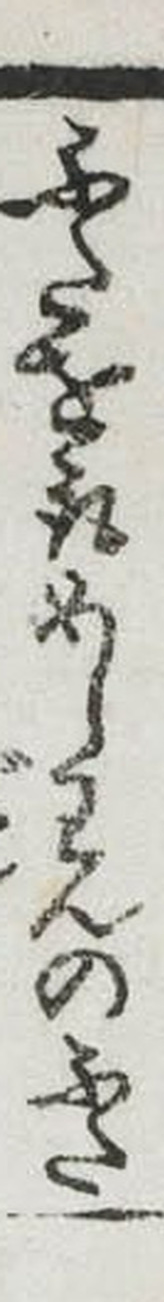ふたを取めしわんのふた
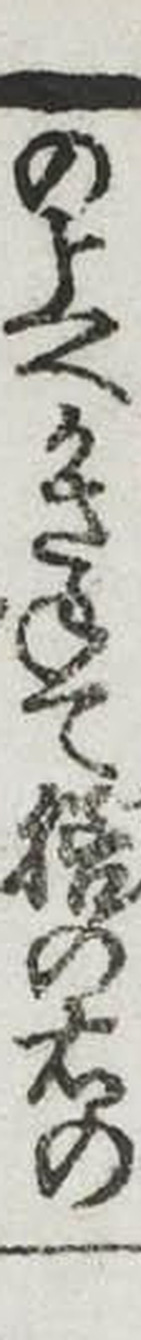の上へかさねて膳の右の
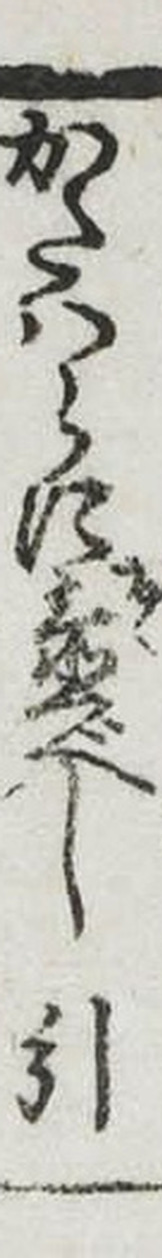かたはらに置べし引
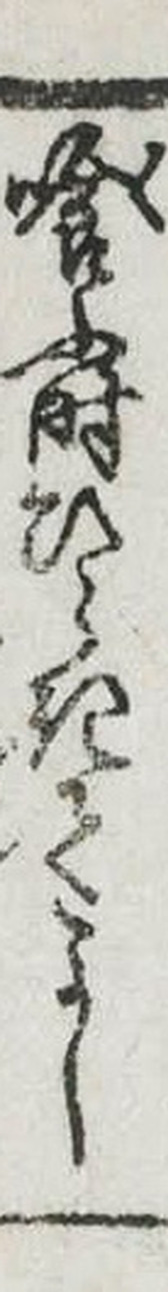喰ふ時ひらきてよし
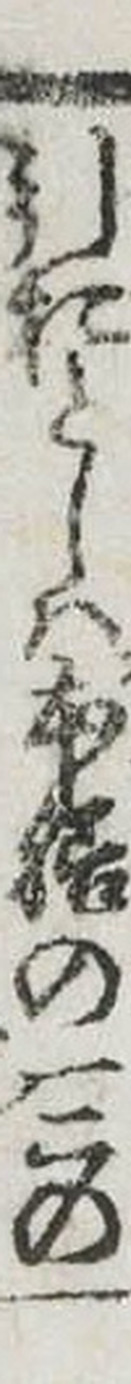引おとしは本膳の一二の
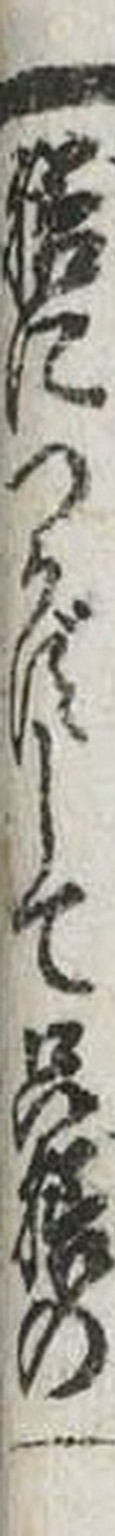膳につかずして只膳の
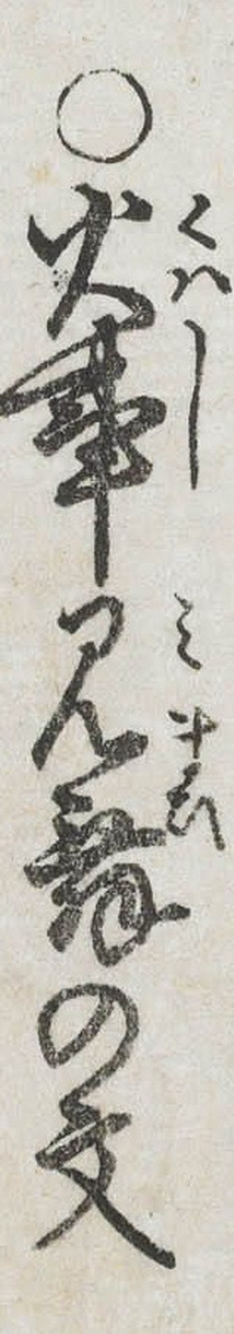○火事見舞の文
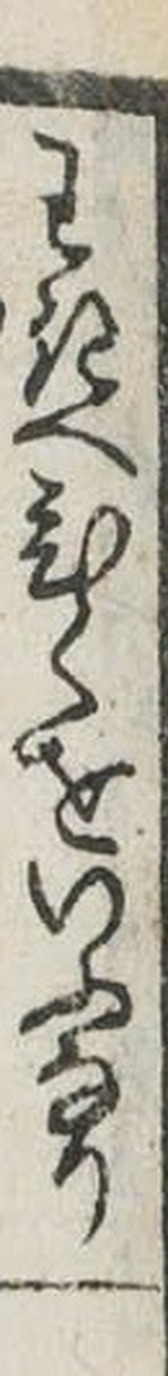わきへひくをいふなり
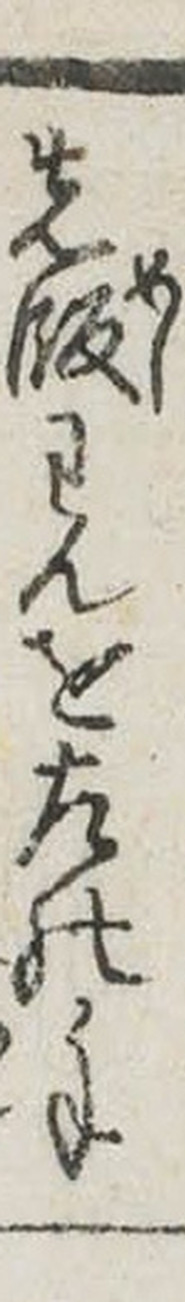先飯わんを左の手
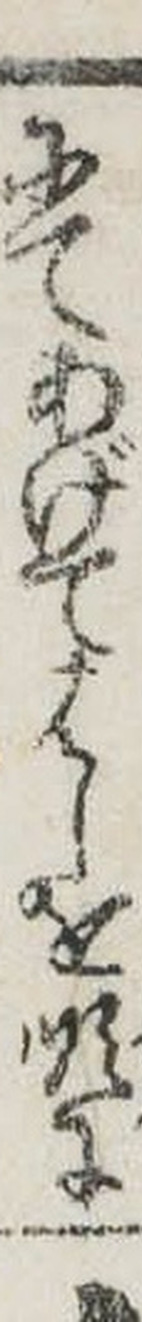にてあげてはしを順に
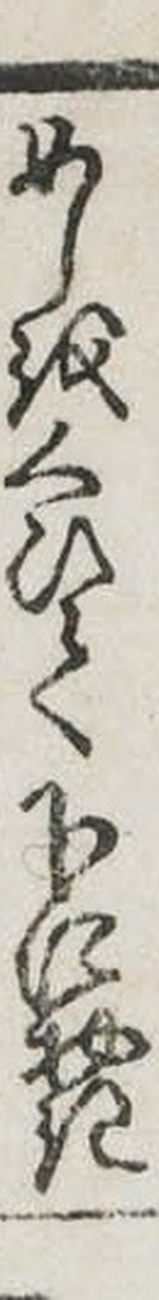めしをくひて下におき
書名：頭書萬用婦人手紙之文言
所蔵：東京学芸大学教育コンテンツアーカイブ
